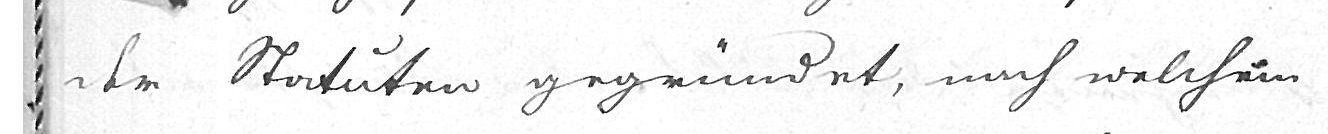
der Statuten gegründet, nach welchem
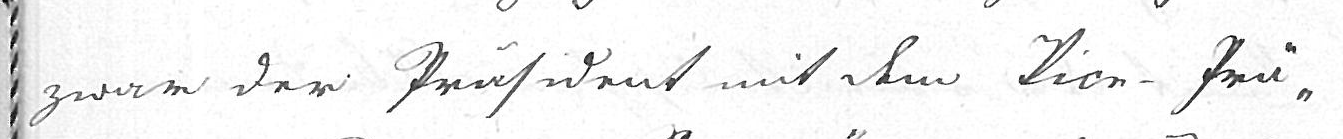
zwar der Präsident mit dem Vice-Prä-
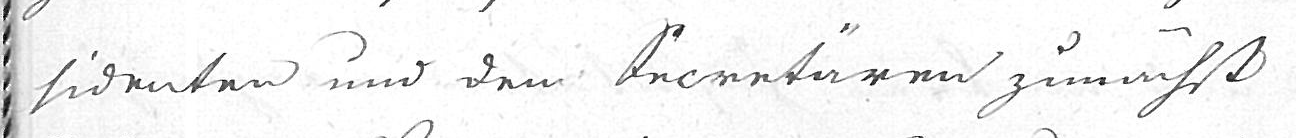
sidenten und den Secretären zunächst
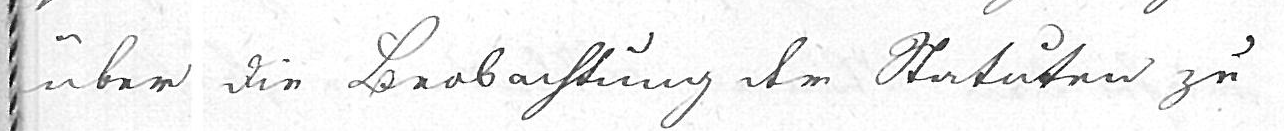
über die Beobachtung der Statuten zu
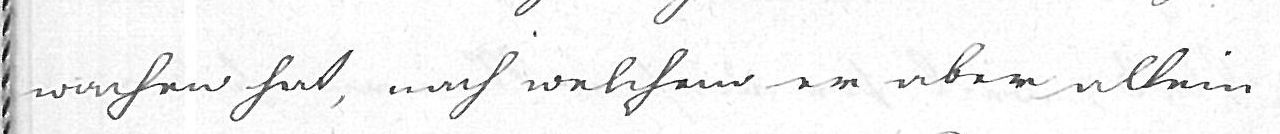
wachen hat, nach welchem er aber allein
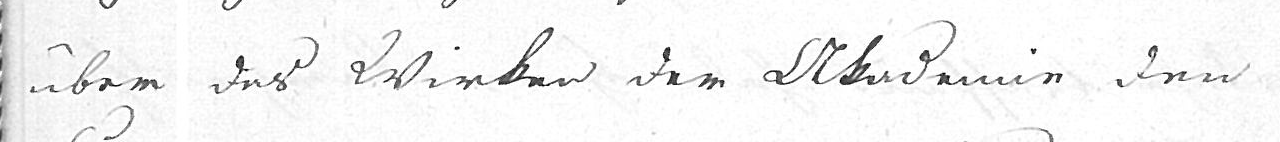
über das Wirken der Akademie den
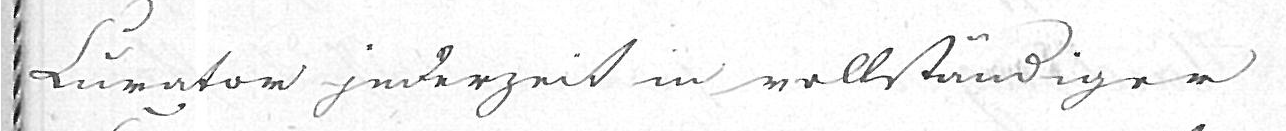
Curator jederzeit in vollständiger
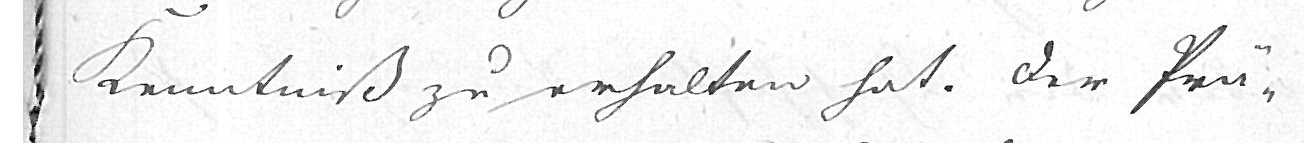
Kenntniß zu erhalten hat. Der Prä-
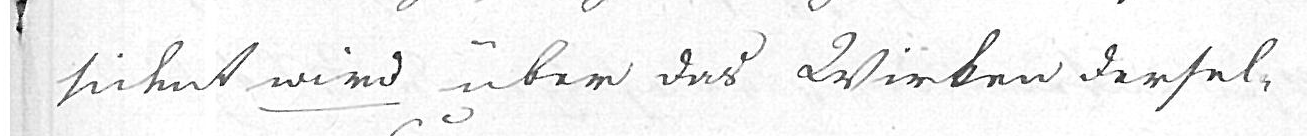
sident wird über das Wirken dersel-
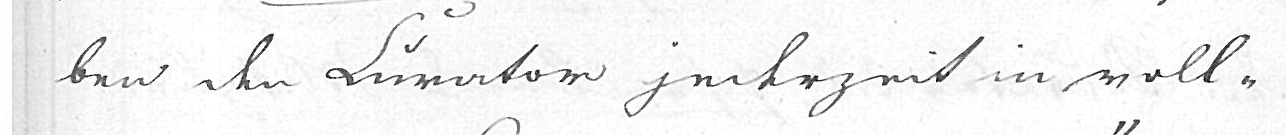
ben den Curator jederzeit in voll-
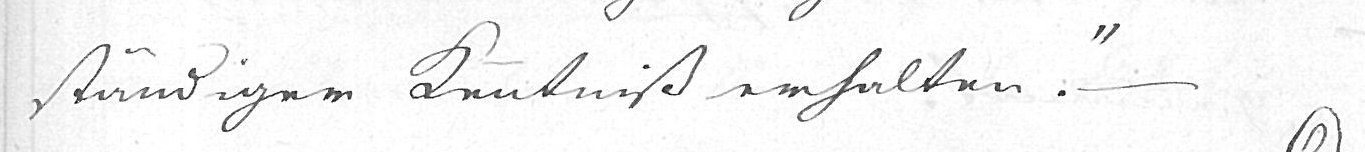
ständiger Kenntniß erhalten."
